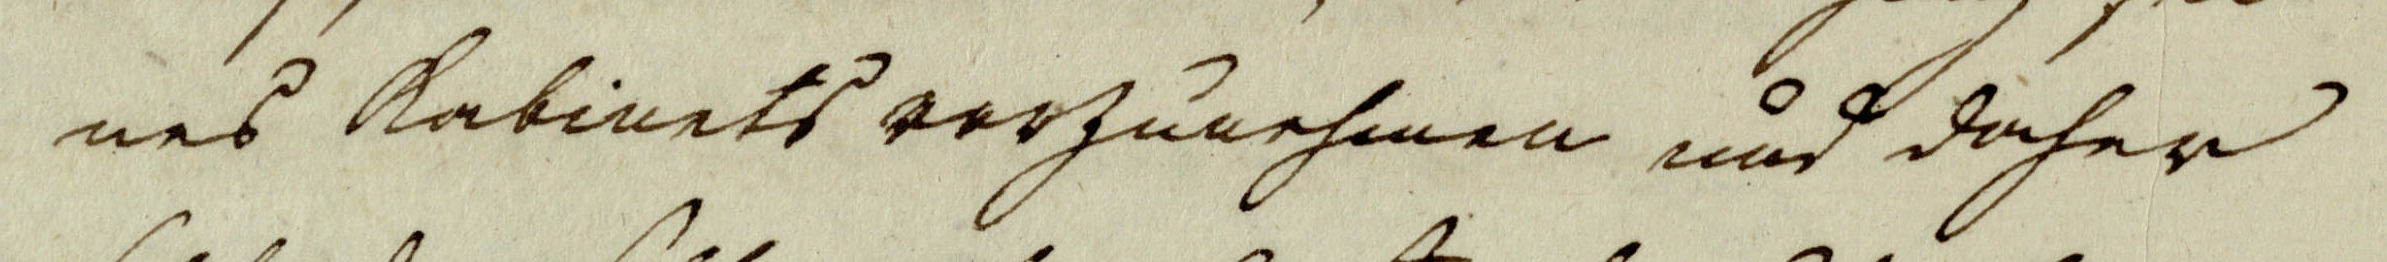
nes Kabinets vorzunehmen und daher
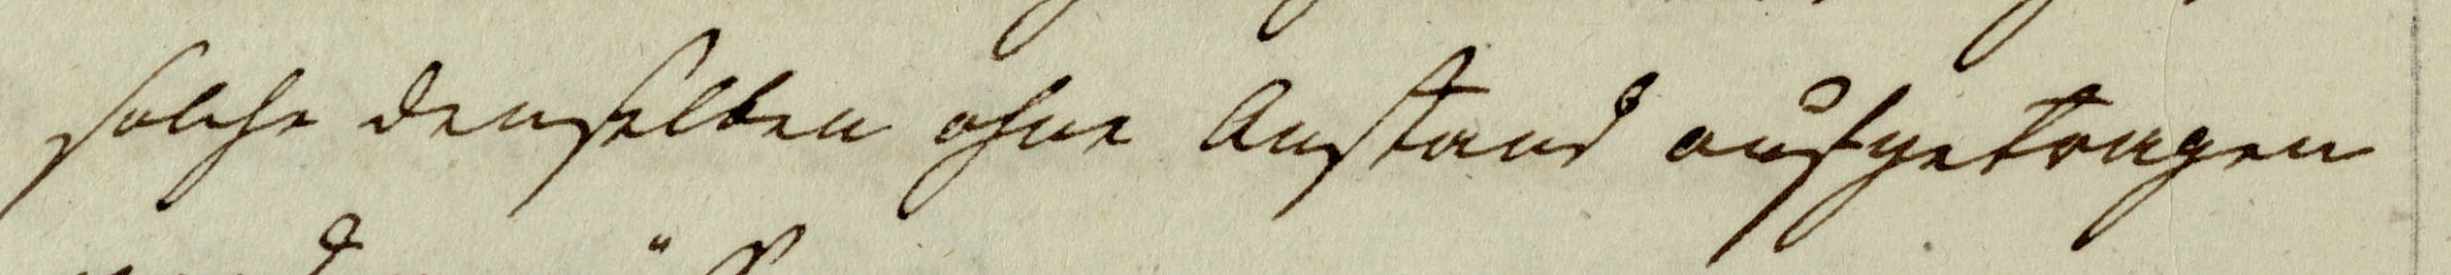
solche denselben ohne Anstand aufgetragen
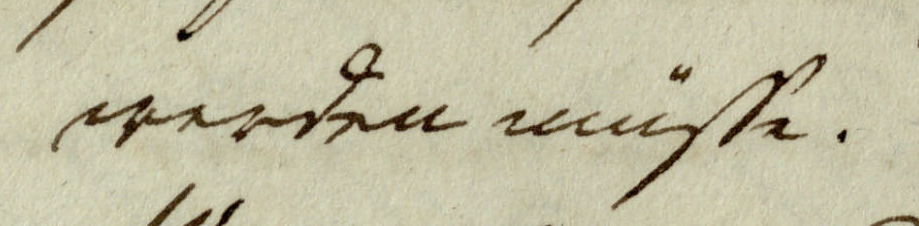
werden müsse.
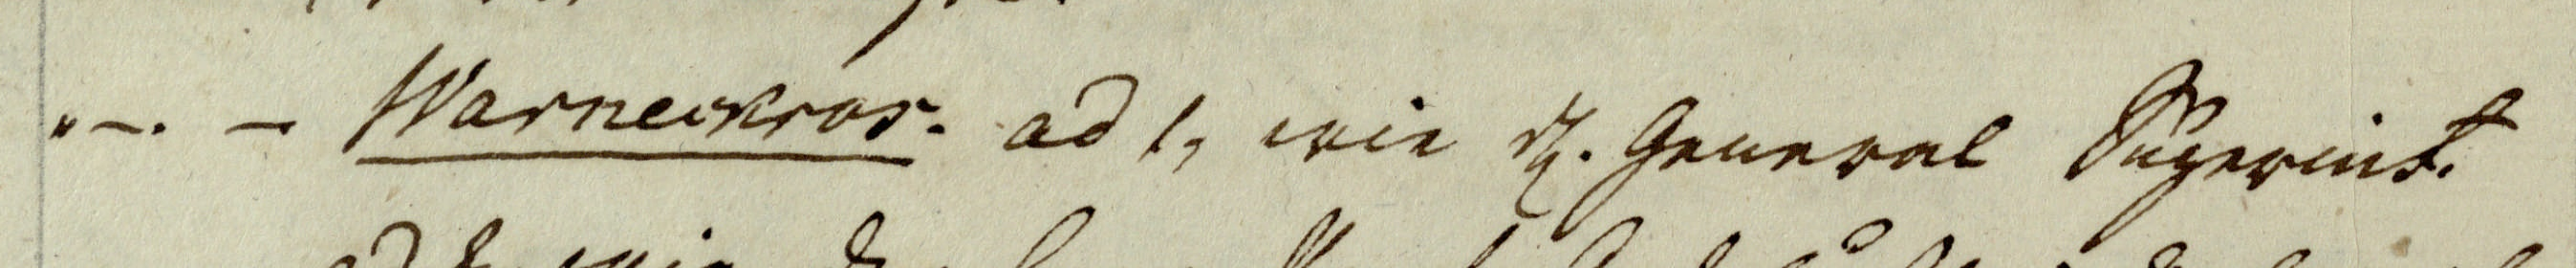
Warneckros. ad 1., wie dh. General Superint.
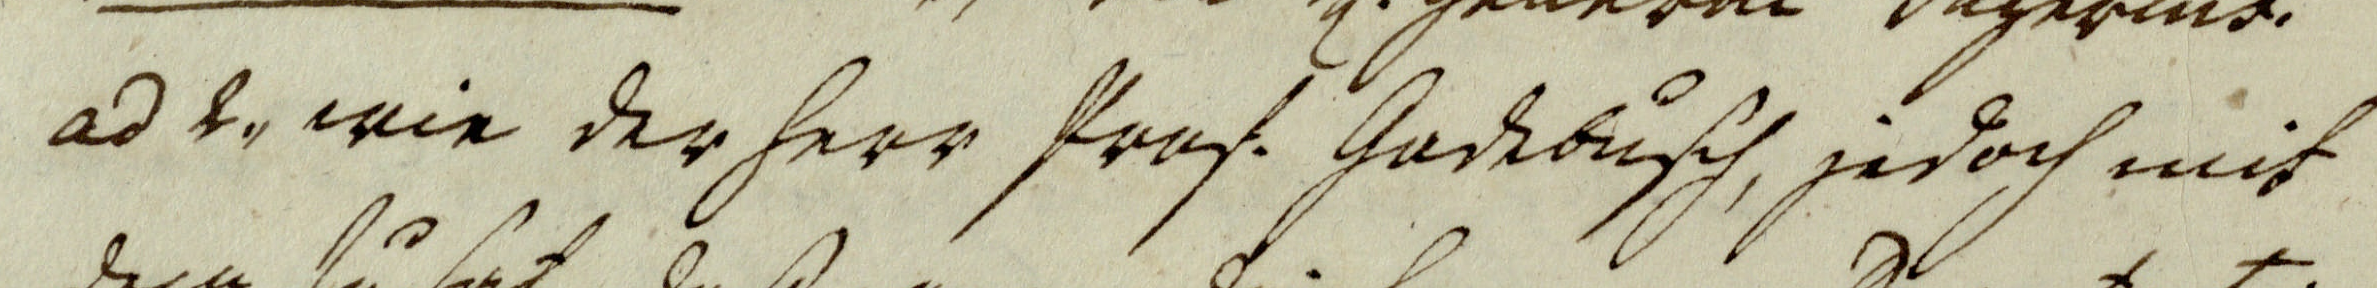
ad 2., wie der Herr Prof. Gadebusch, jedoch mit
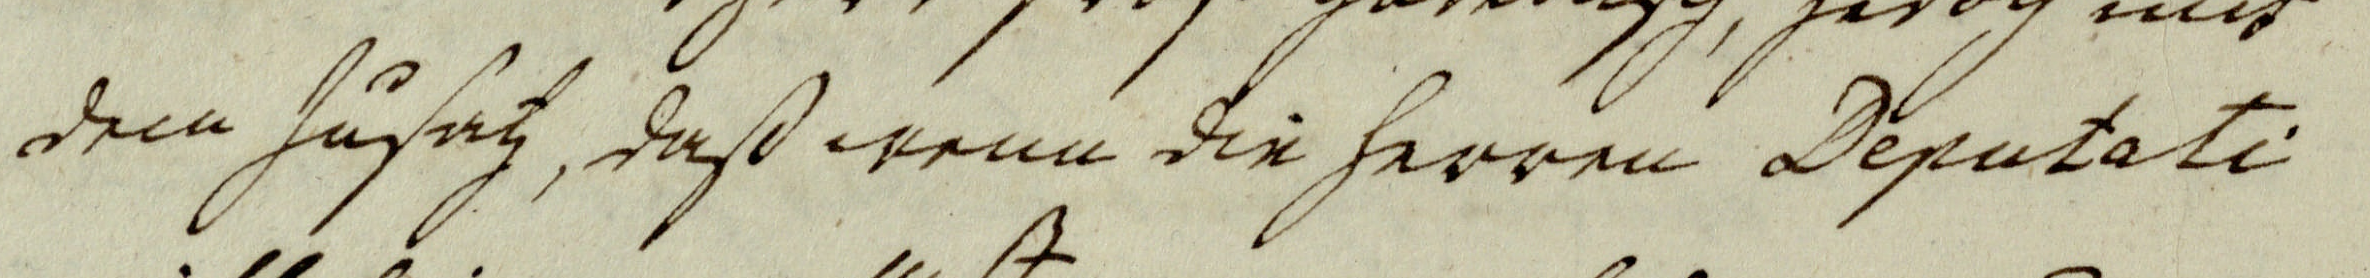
dem Zusatz, daß wenn die Herren Deputati
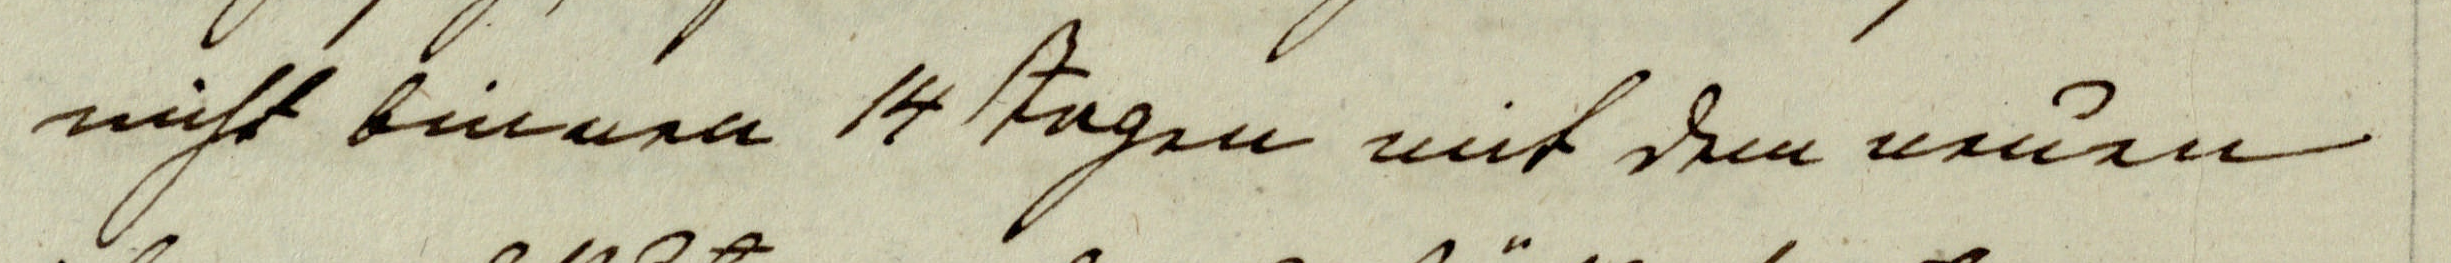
nicht binnen 14 Tagen mit dem neuen
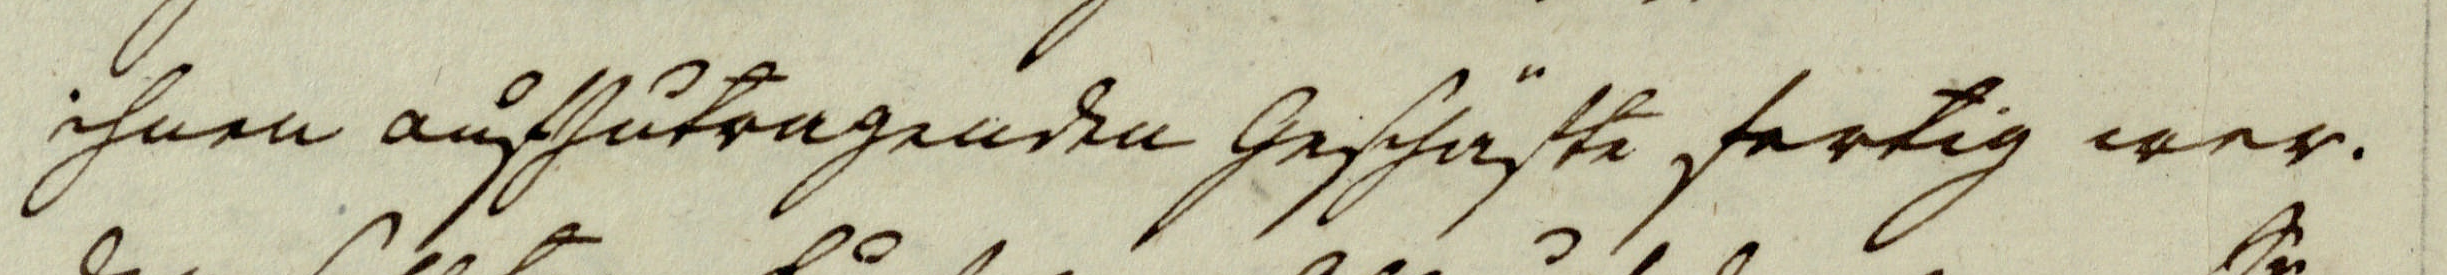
ihnen aufzutragenden Geschäfte fertig wer¬
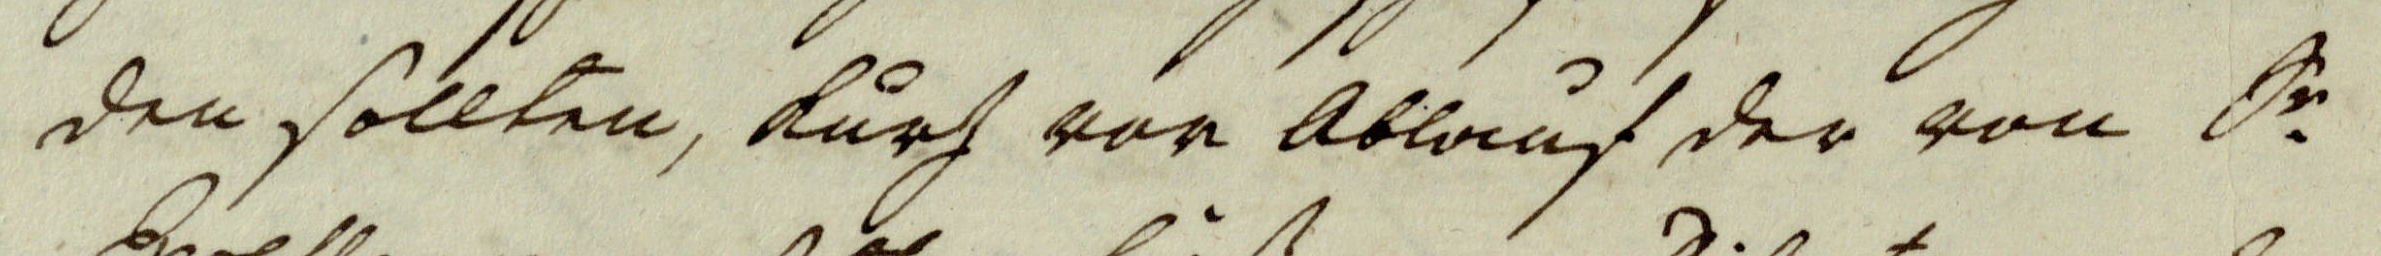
den sollten, kurz vor Ablauf der vom Sr.
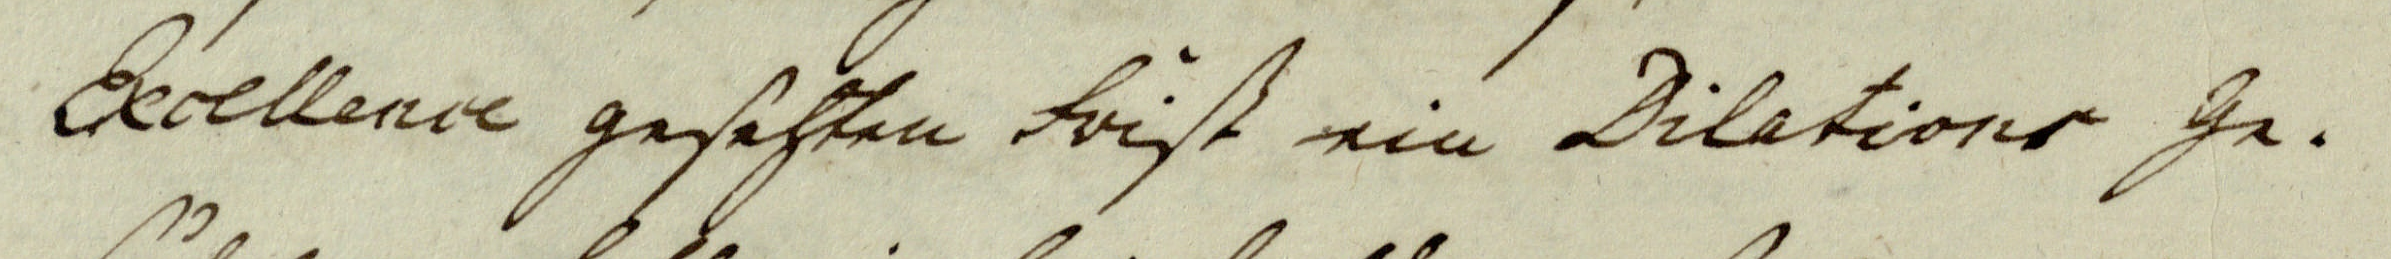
Excellence gesetzten Frist ein Dilations Ge¬
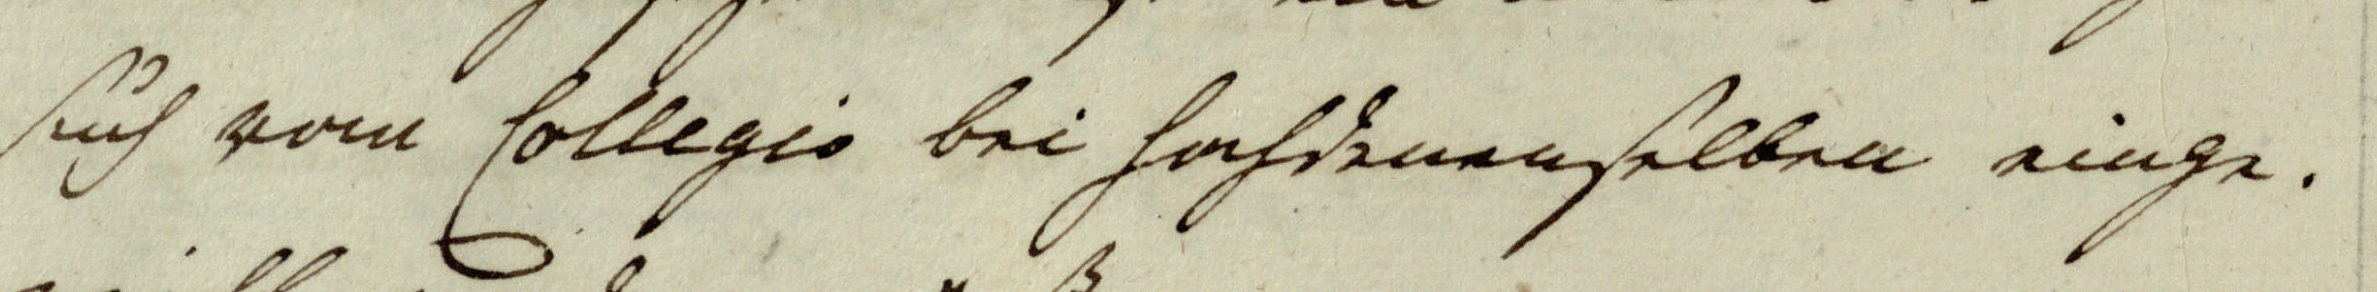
such vom Collegio bei Hochdenenselben einge¬
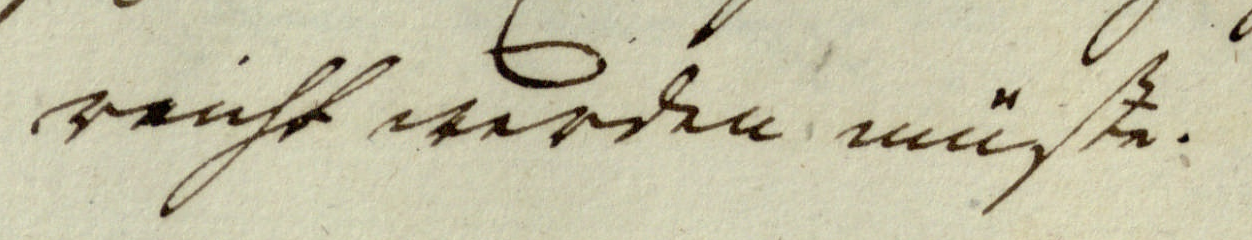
reicht werden müßte.
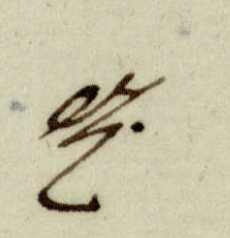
dh.
